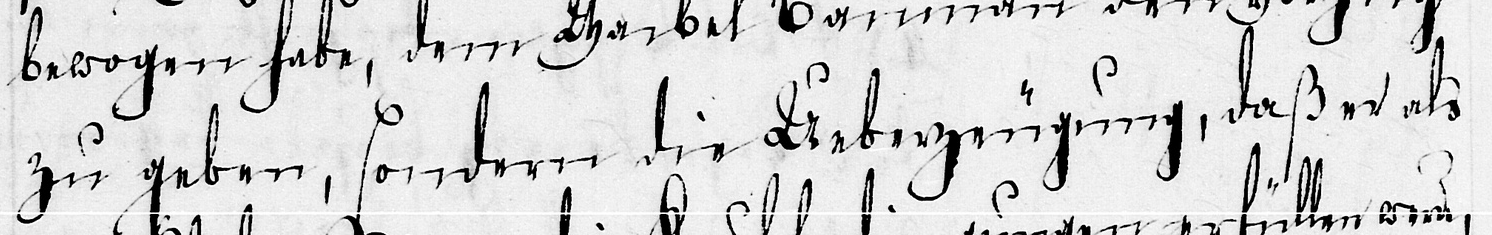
zu geben, sondern die Ueberzeugung, daß er als
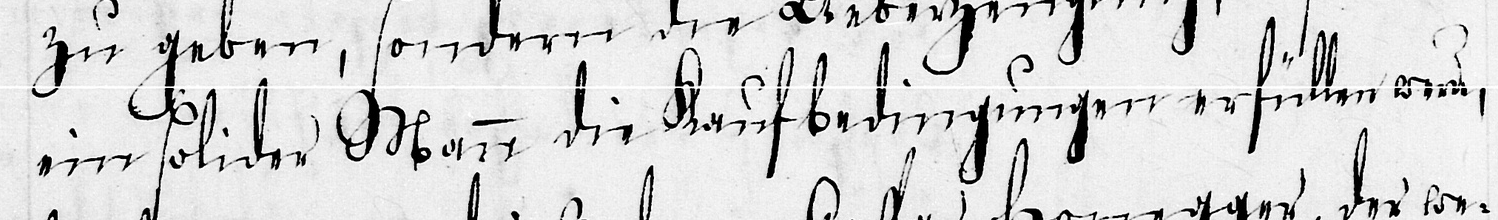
ein solider Mann die Kaufbedingungen erfüllen
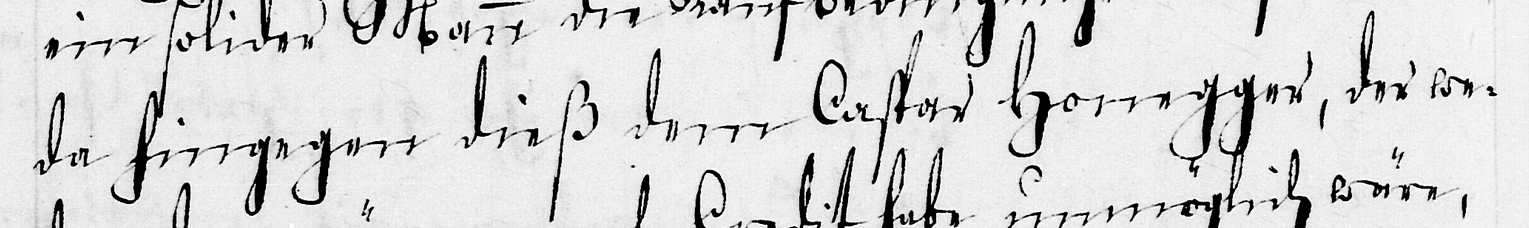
da hingegen dieß dem Caspar Honegger, der we¬
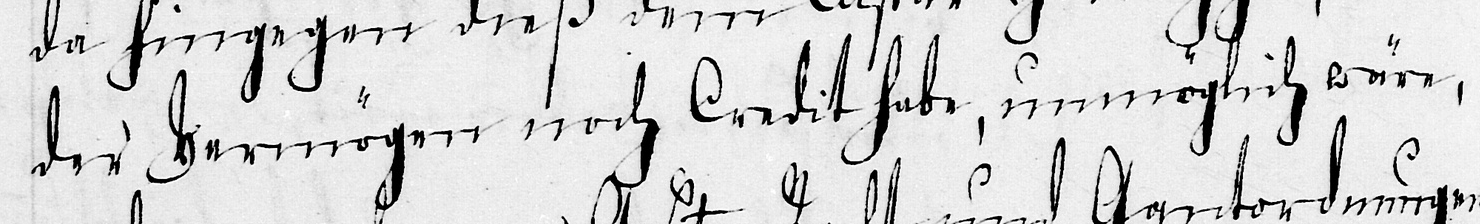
der Vermögen noch Credit habe, unmöglich wäre,
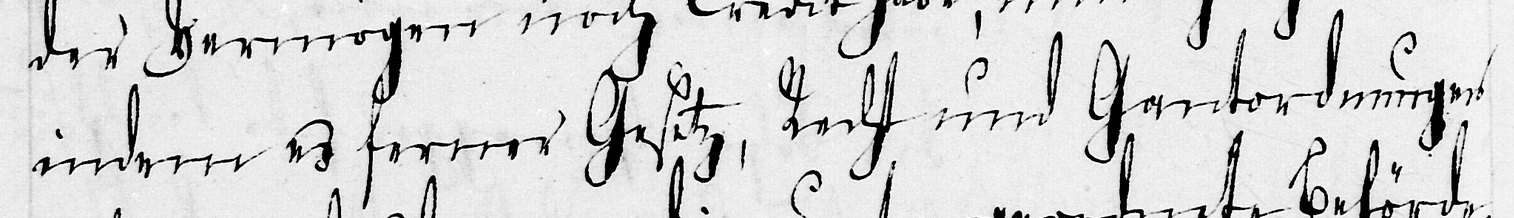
indem es ferner Gesetz, Recht und Gantordnungen
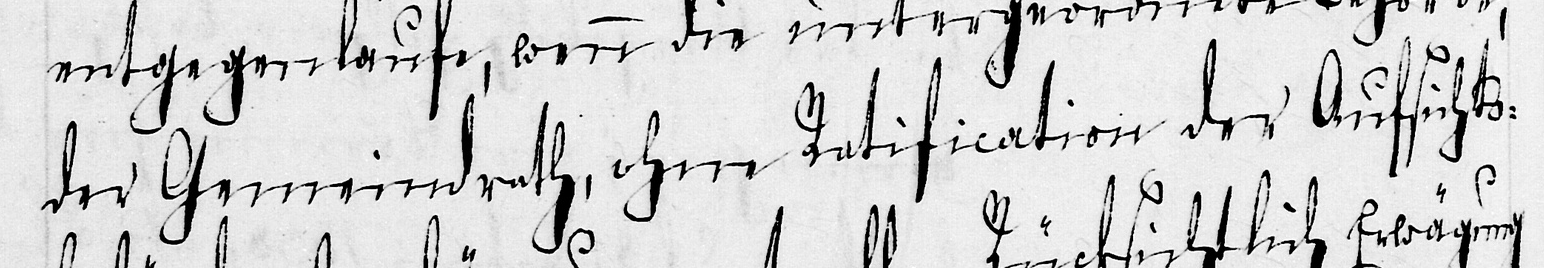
der Gemeindrath, ohne Ratification der Aufsichts¬
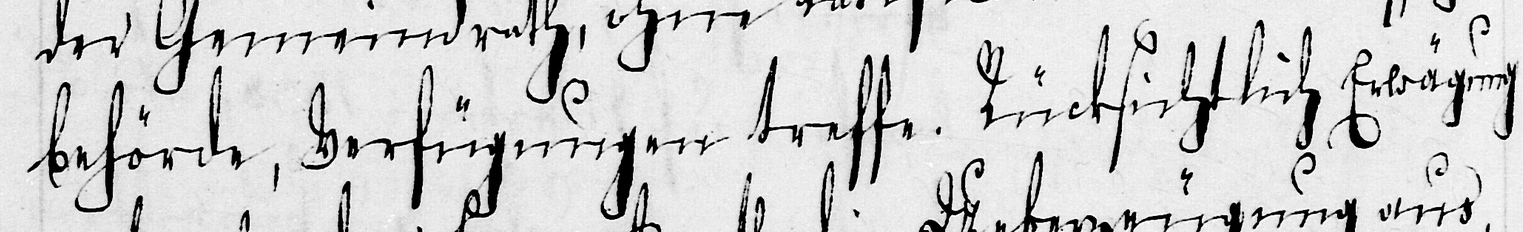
behörde, Verfügungen treffe. Rücksichtlich Erwä¬
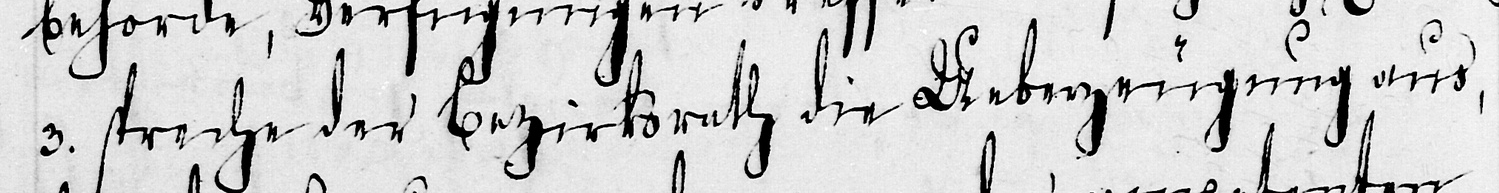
3. spreche der Bezirksrath die Ueberzeugung aus,
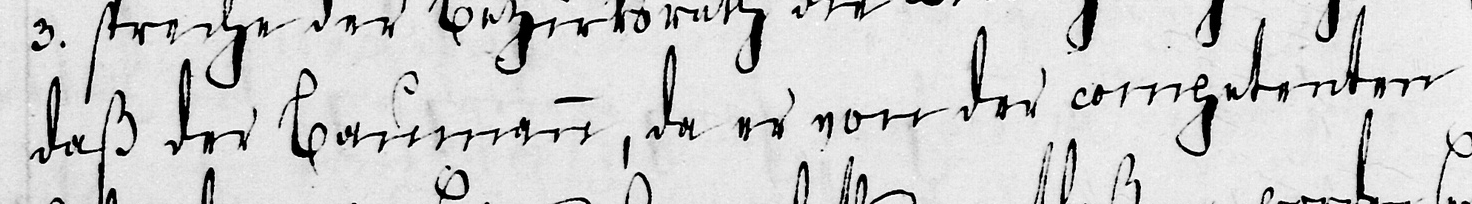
daß der Baumann, da er von der competenten
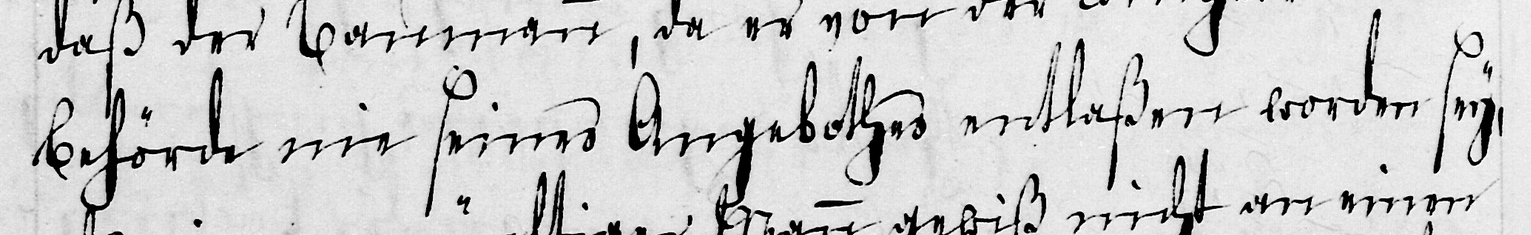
Behörde nie seines Angebothes entlaßen worden sey,
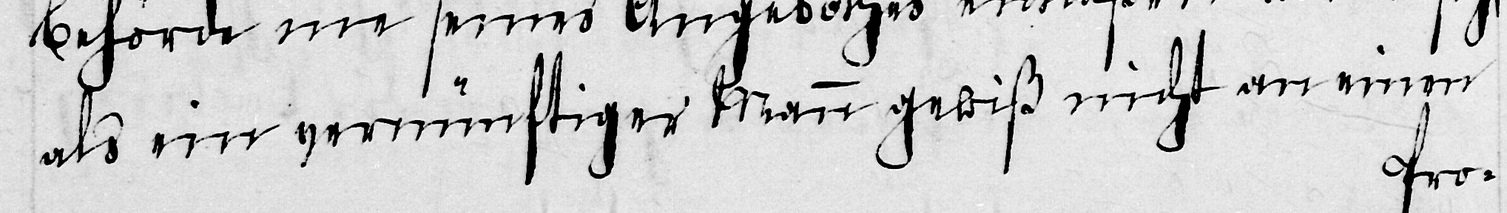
als ein vernünftiger Mann gewiß nicht an einen
